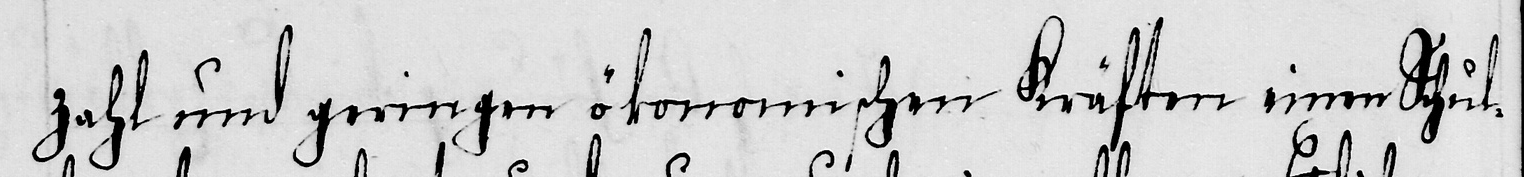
zahl und geringen ökonomischen Kräften einen Schul¬
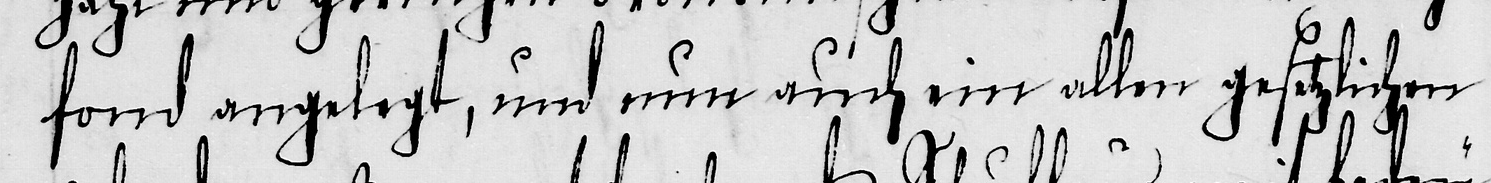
fond angelegt, und nun auch ein allen gesetzlichen
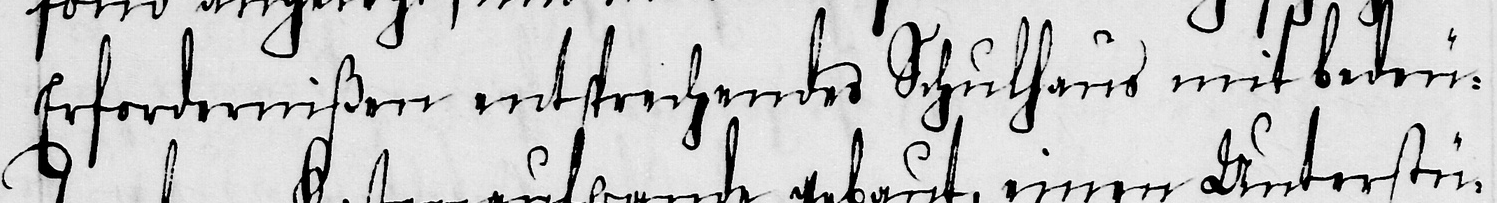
Erfordernißen entsprechendes Schulhaus mit bedeu¬
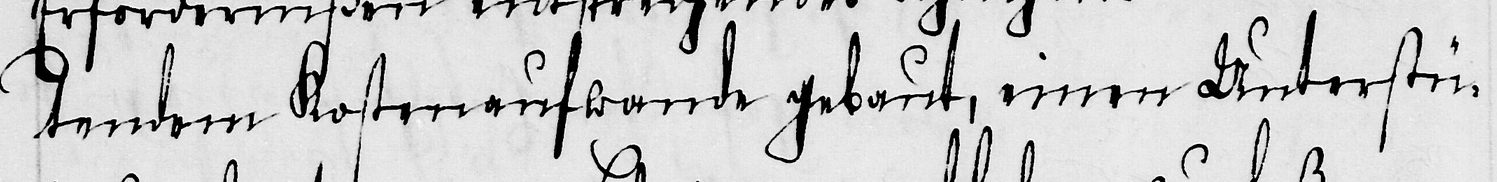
tendem Kostenaufwande gebaut, einen Unterstü¬
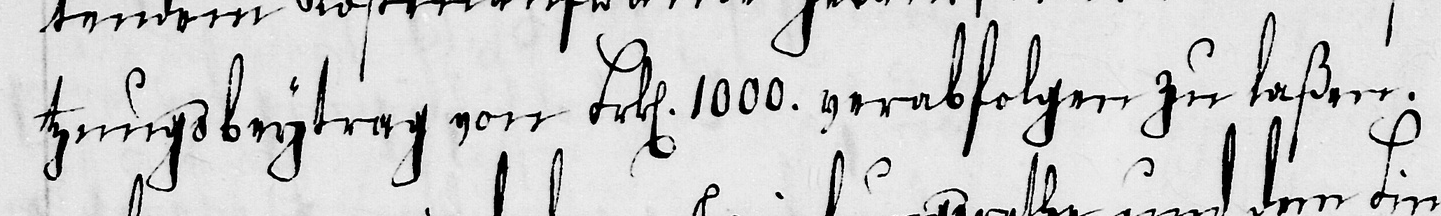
tzungsbeytrag von Frk. 1000. verabfolgen zu laßen.
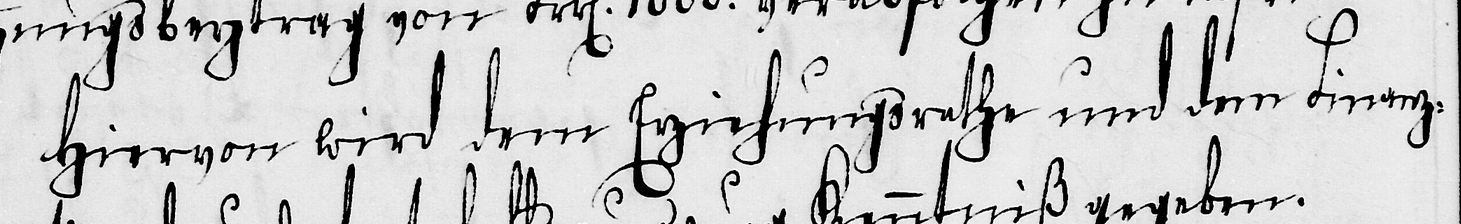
Hiervon wird dem Erziehungsrathe und dem Finanz¬
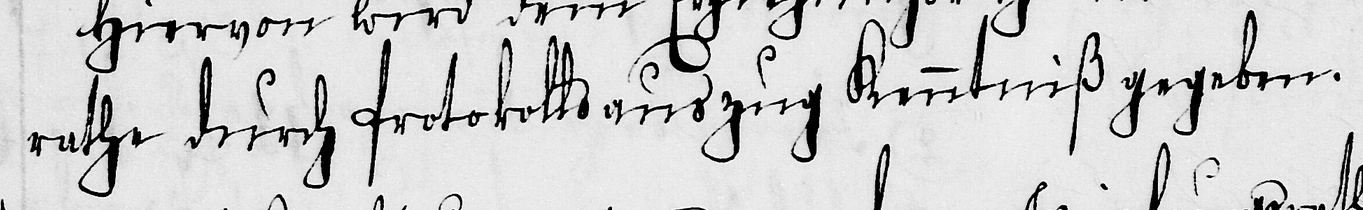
rathe durch Protokollsauszug Kenntniß gegeben.
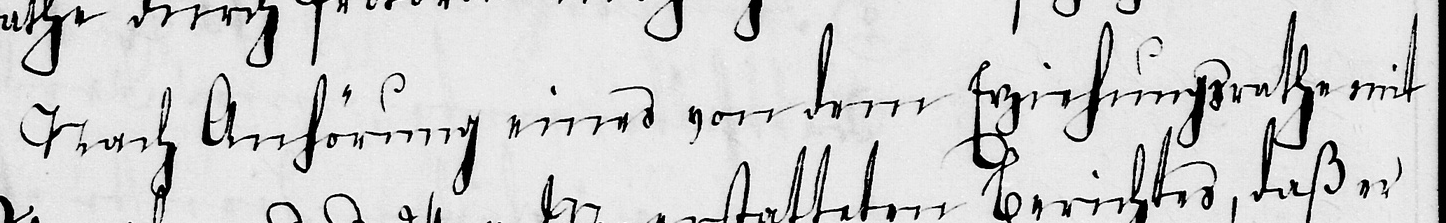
Nach Anhörung eines von dem Erziehungsrathe mit
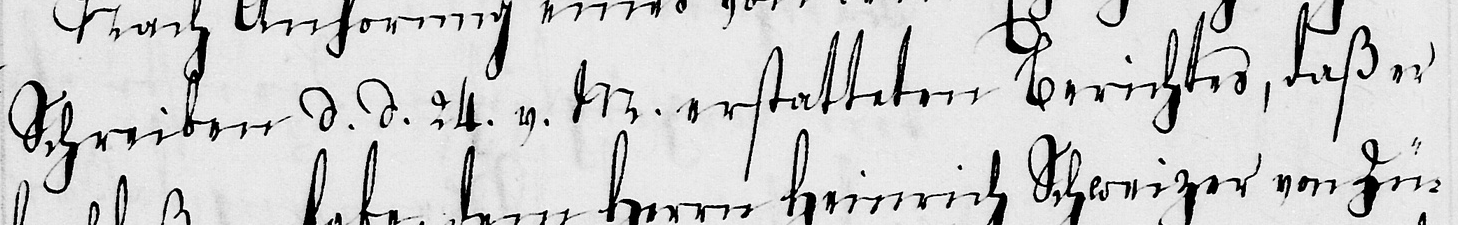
Schreiben d. d. 24. v. M. erstatteten Berichtes, daß er
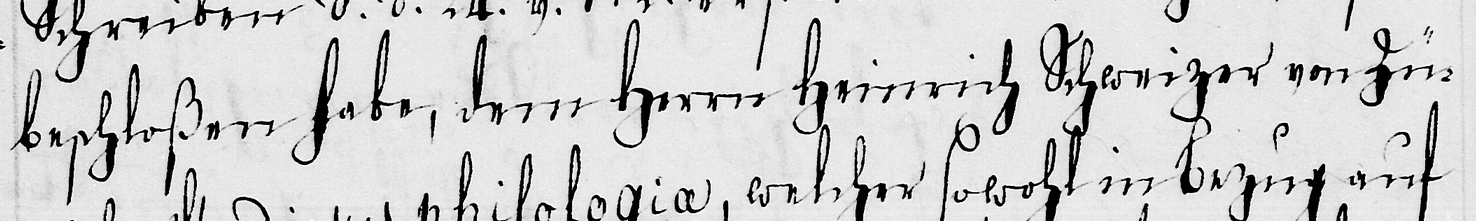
beschloßen habe, dem Herrn Heinrich Schweizer von Zü¬
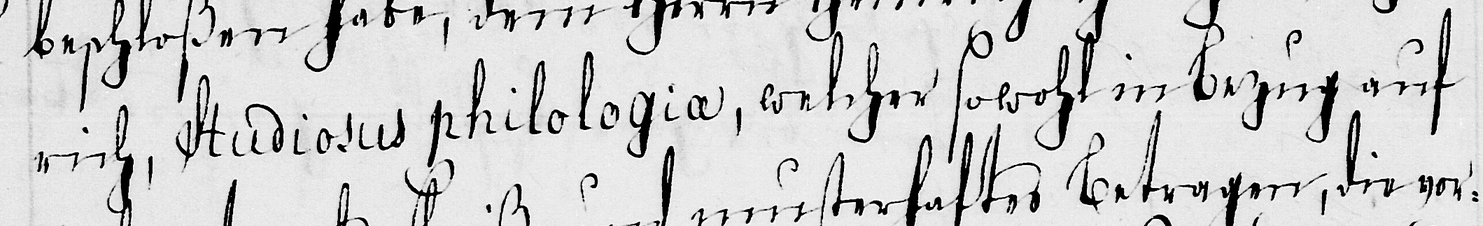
rich, Studiosus philologia, welcher sowohl in Bezug auf
